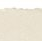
nous
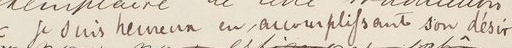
et je suis heureux en accomplissant son désir
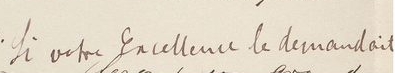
Si votre Excellence le demandait
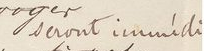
seront immédiatement
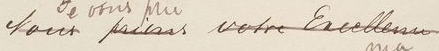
Nous prions votre Excellence
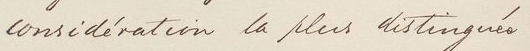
considération la plus distinguée
